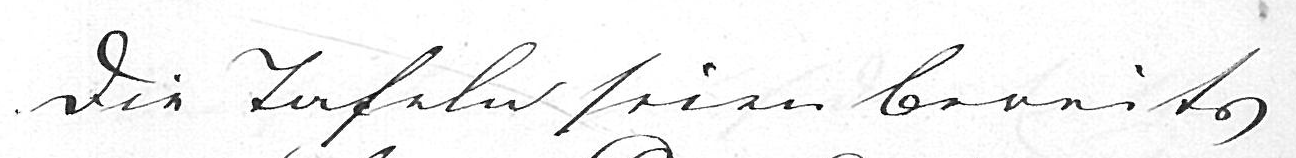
Die Tafeln seien bereits
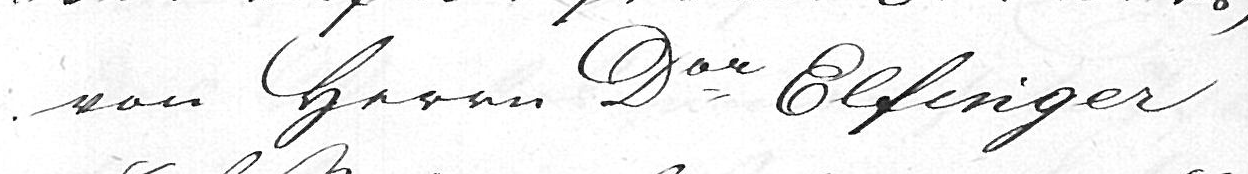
von Herrn Dor Elfinger
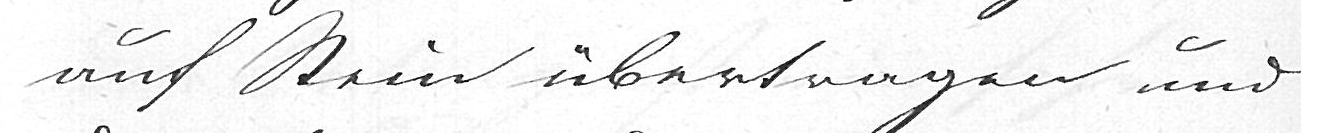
auf Stein übertragen und
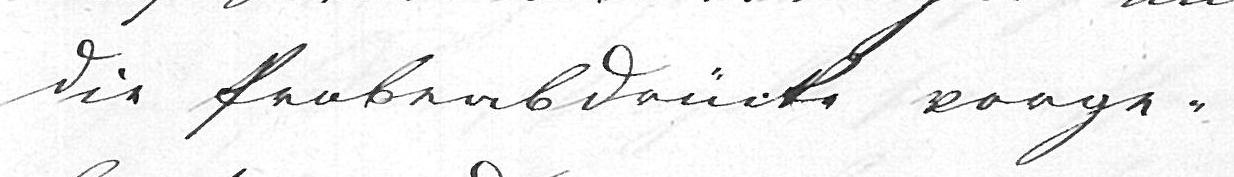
die Probeabdrücke vorge-
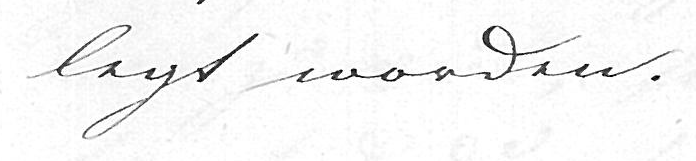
legt worden.
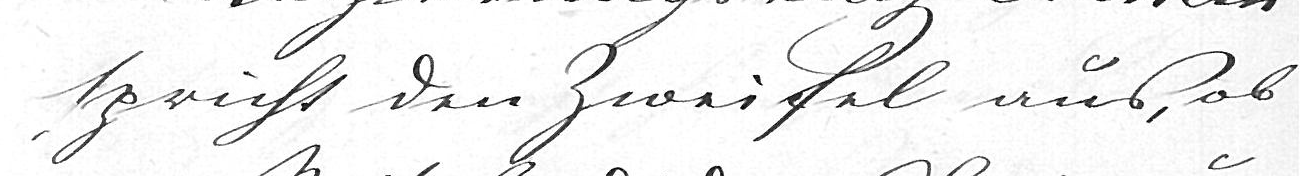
spricht den Zweifel aus, ob
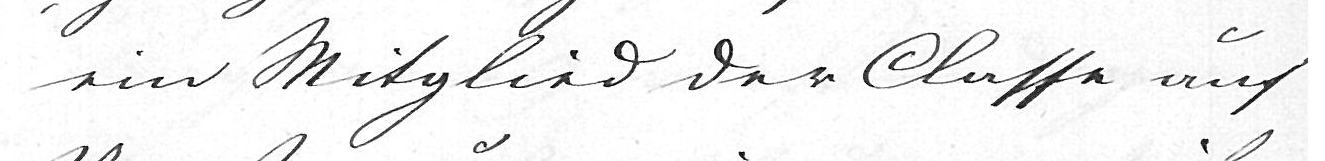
ein Mitglied der Classe auf
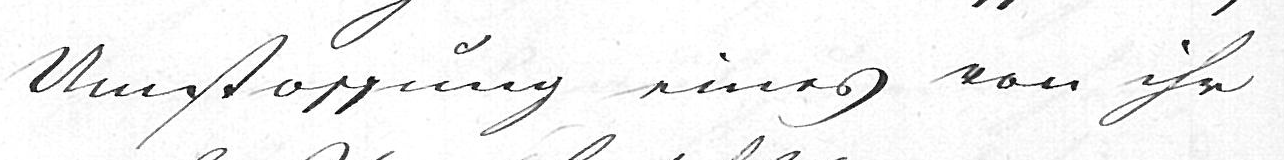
Umstossung eines von ihr
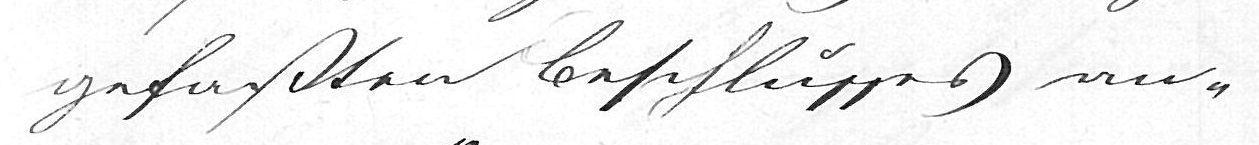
gefaßten Beschlusses) an-
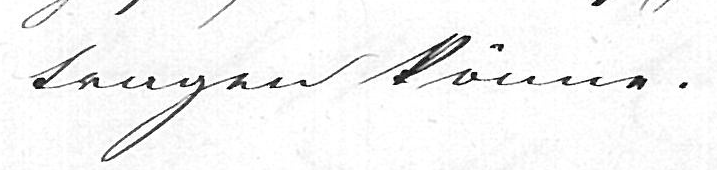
tragen könne.
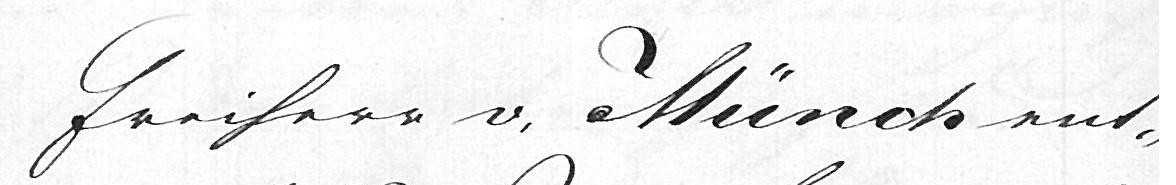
Freiherr v. Münch ent-
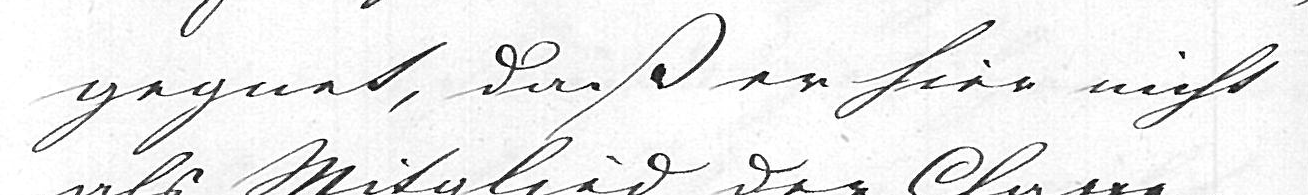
gegnet, daß er hier nicht
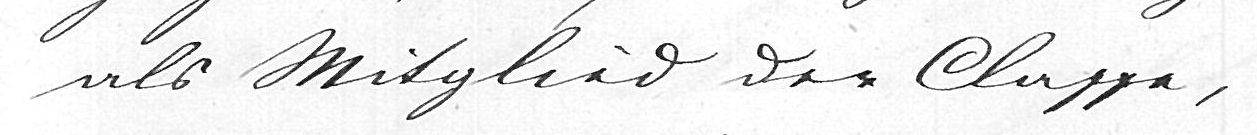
als Mitglied der Classe,
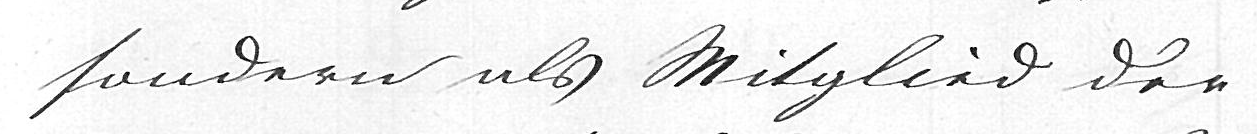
sondern als Mitglied der
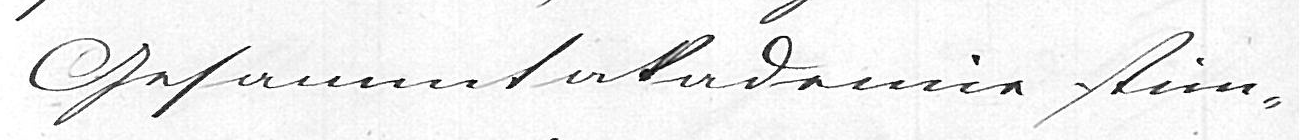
Gesamtakademie stim-
